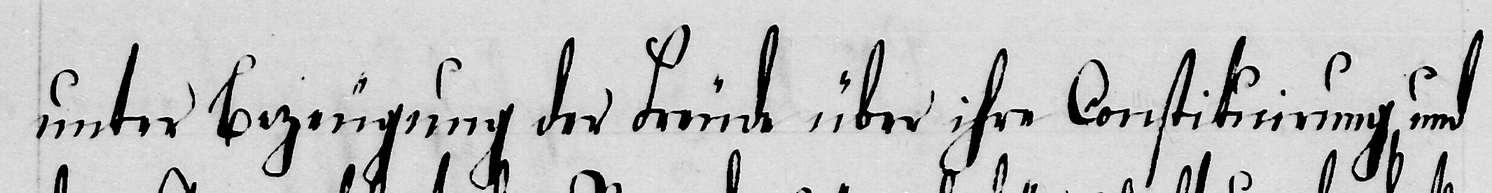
unter Bezeugung der Freude über ihre Constituirung, und
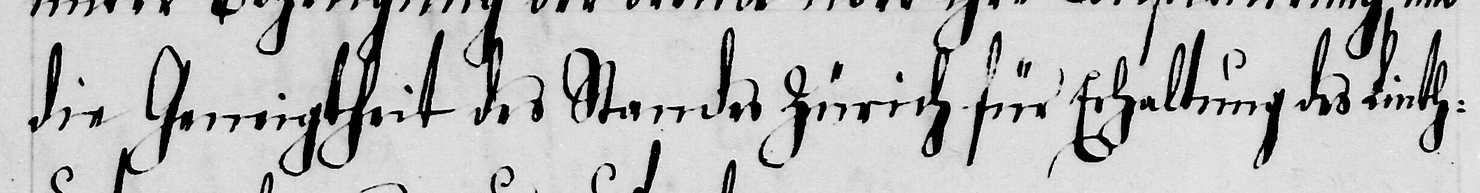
die Geneigtheit des Standes Zürich für Erhaltung des Li¬
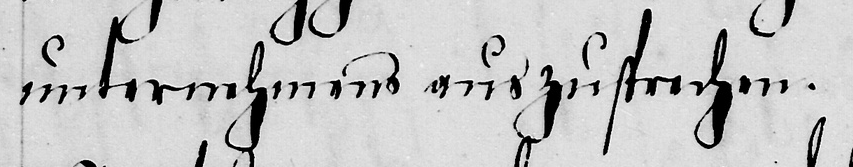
unternehmens auszusprechen.
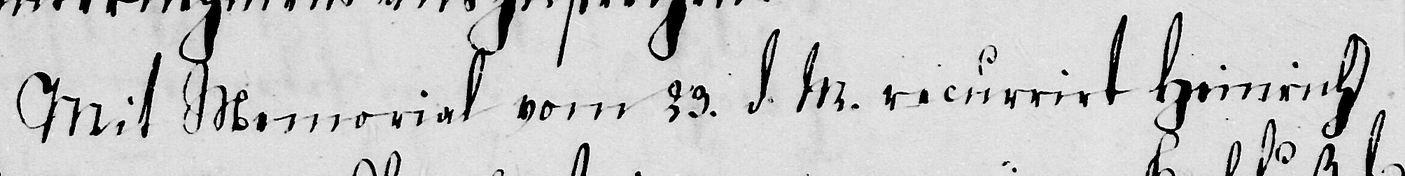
Mit Memorial vom 23. d. M. recurrirt Heinrich
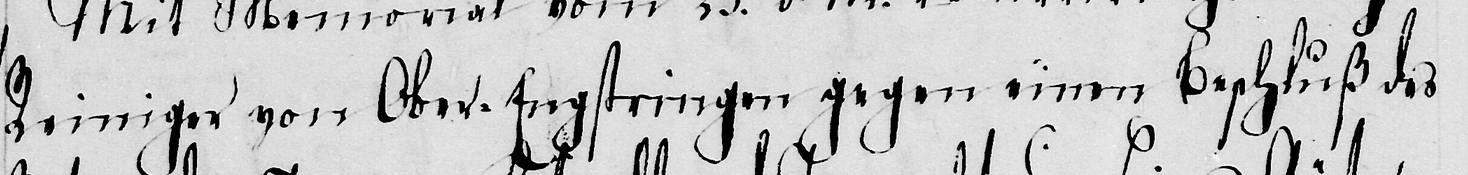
Reiniger von Ober-Engstringen gegen einen Beschluß des
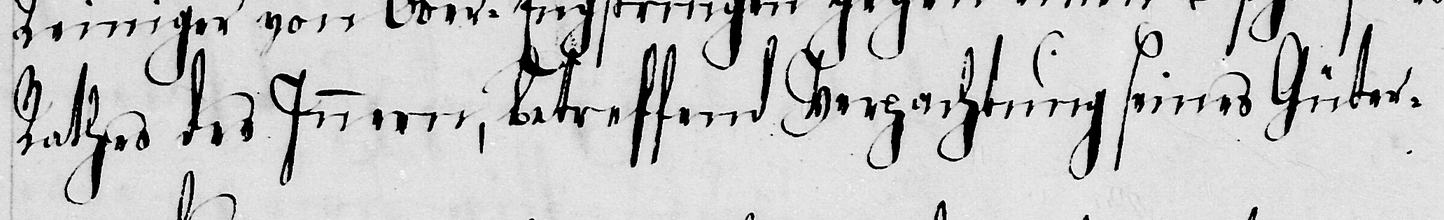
Rathes des Innern, betreffend Verpachtung seines Güter¬
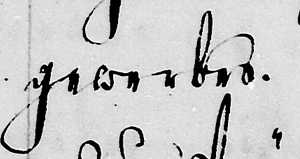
gewerbes.
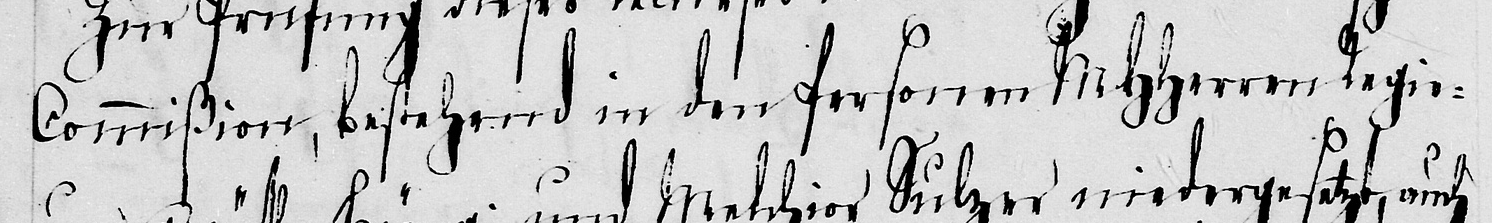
Commißion, bestehend in den Personen MHHerren Regie¬
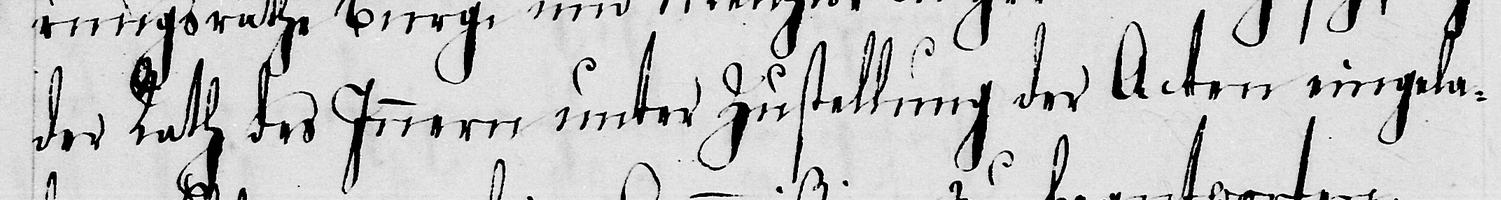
der Rath des Innern unter Zustellung der Acten eingela¬
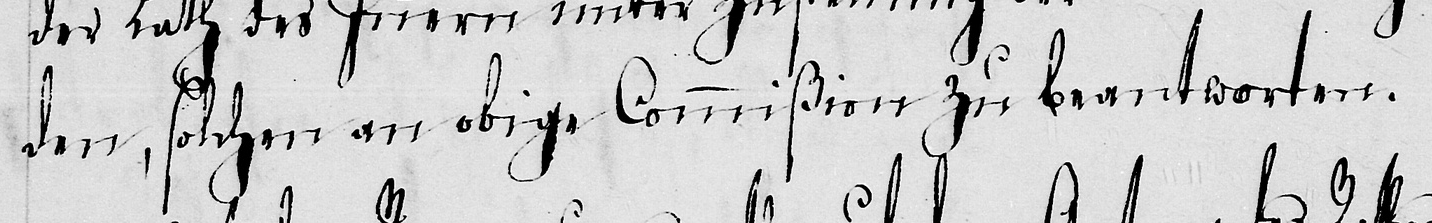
den, solchen an obige Commißion zu beantworten.
